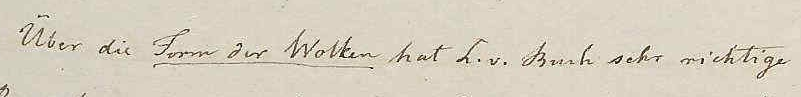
Über die Form der Wolken hat L. v. Buch sehr richtige
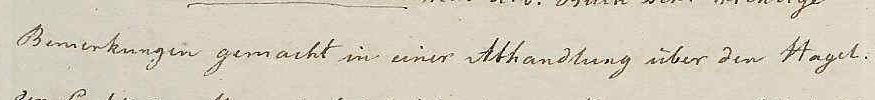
Bemerkungen gemacht in einer Abhandlung über den Hagel.
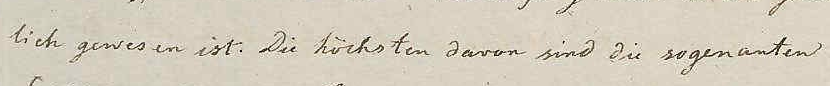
lich gewesen ist. Die höchsten davon sind die sogenanten
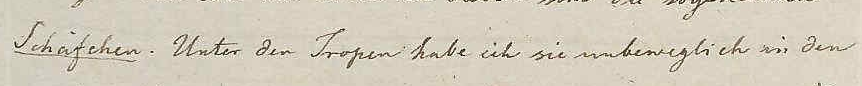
Schäfchen. Unter den Tropen habe ich sie unbeweglich in den
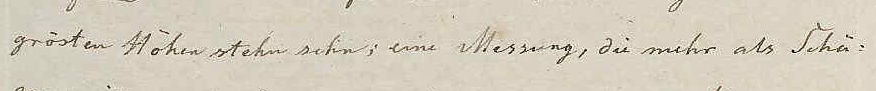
grösten Höhen stehn sehn; eine Messung, die mehr als Schä-
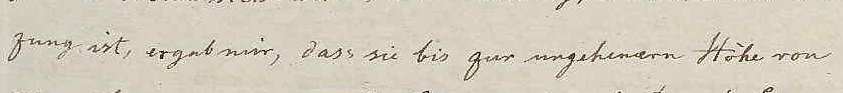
zung ist, ergab mir, dass sie bis zur ungeheuern Höhe von
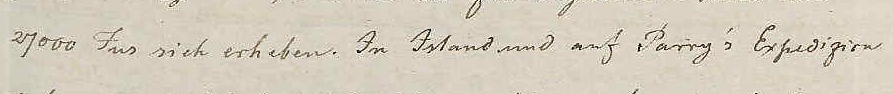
27000 Fus sich erheben. In Island und auf Parry's Expedizion
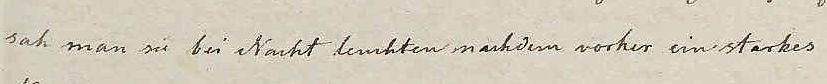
sah man sie bei Nacht leuchten nachdem vorher ein starkes
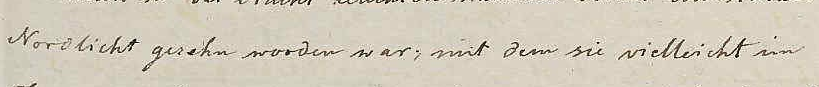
Nordlicht gesehn worden war; mit dem sie vielleicht im
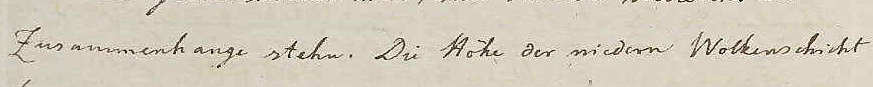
Zusammenhange stehn. Die Höhe der niedern Wolkenschicht
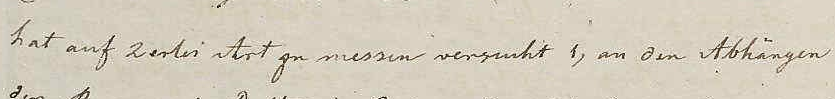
hat auf 2erlei Art zu messen versucht 1, an den Abhängen
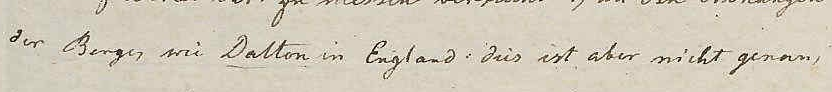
der Berge, wie Dalton in England: dies ist aber nicht genau,
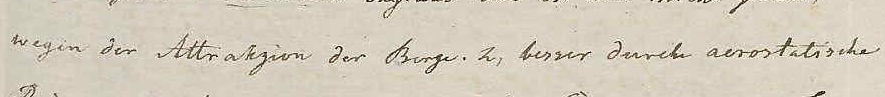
wegen der Attrakzion der Berge. 2, besser durch aerostatische
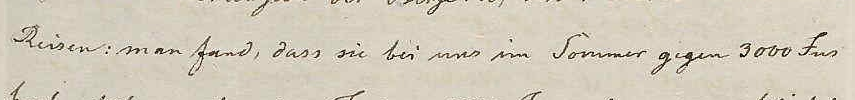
Reisen: man fand, dass sie bei uns im Sommer gegen 3000 Fus
